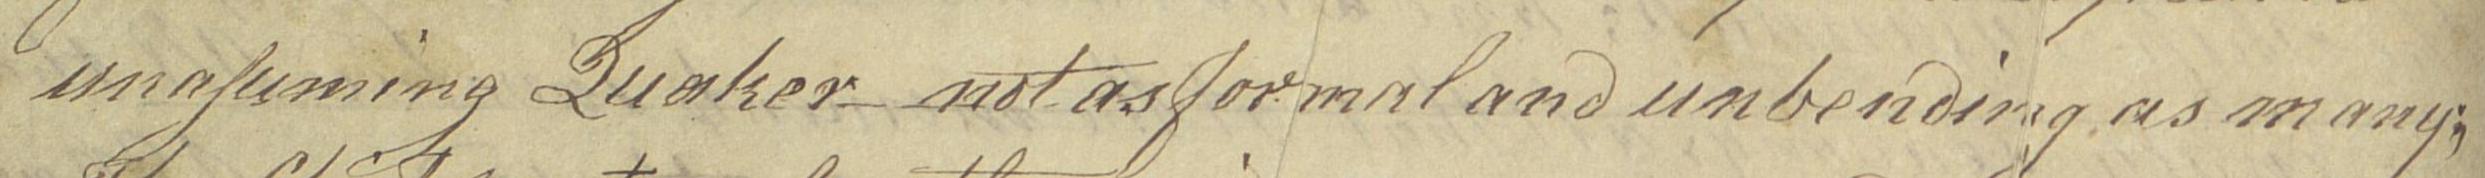unassuming Quaker not as formal and unbending as many;
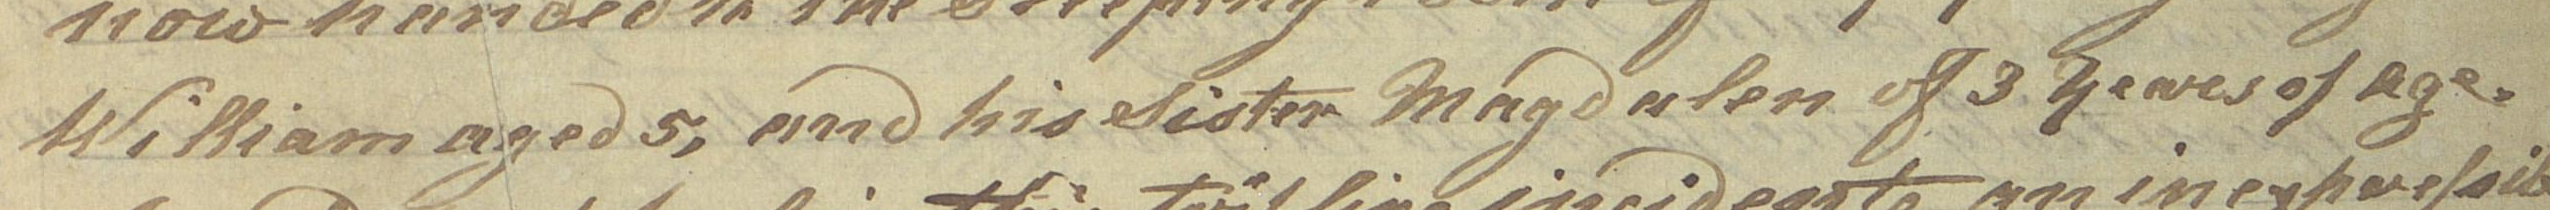William aged 5, and his Sister Magdalen of 3 Years of age.
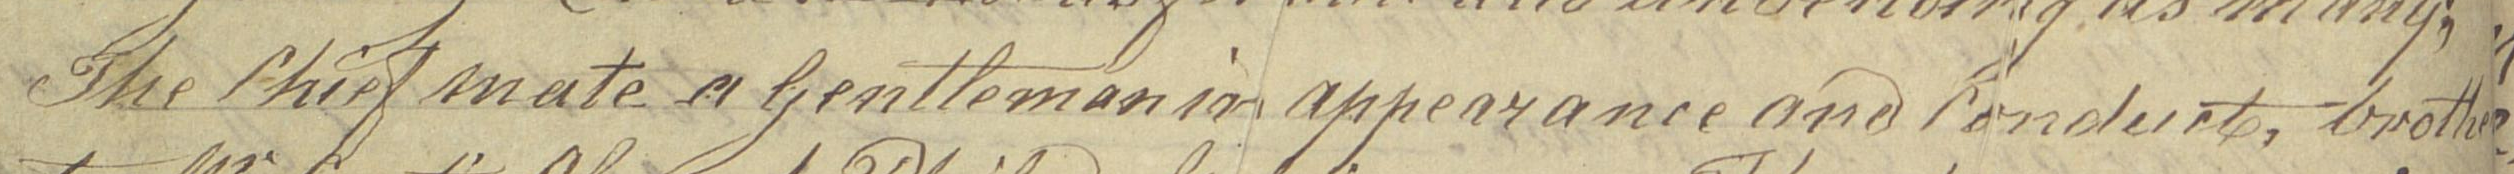The Chief mate a Gentlemen in appearance and Conduct, brother
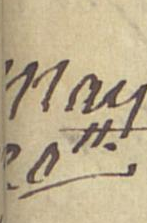May
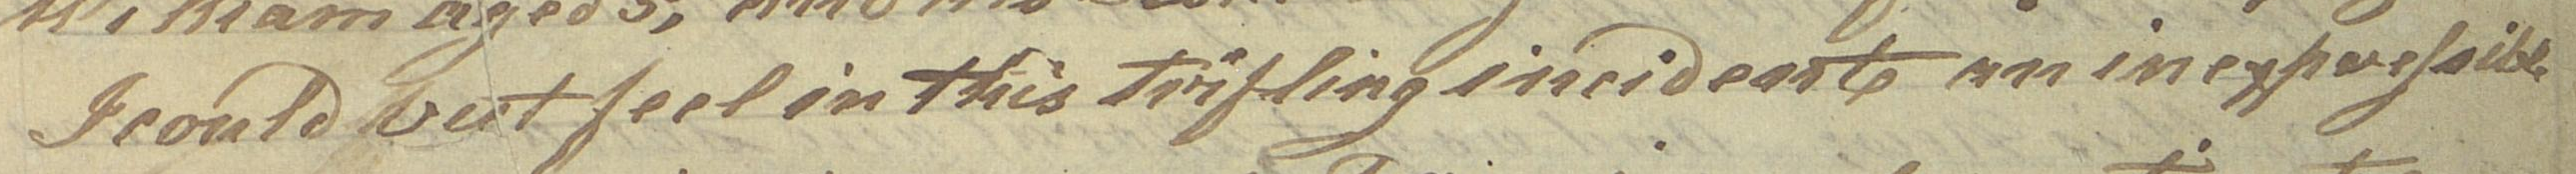I could but feel in this trifling incident in in expressible
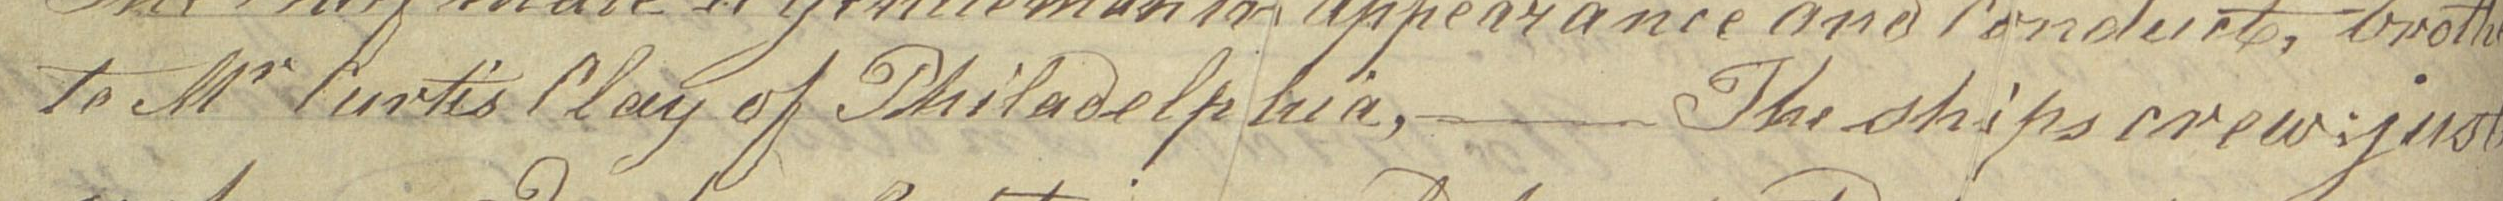to M^r. Curtis Clay of Philladelphia, The ships crew: just
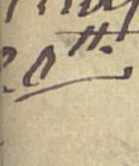20^th
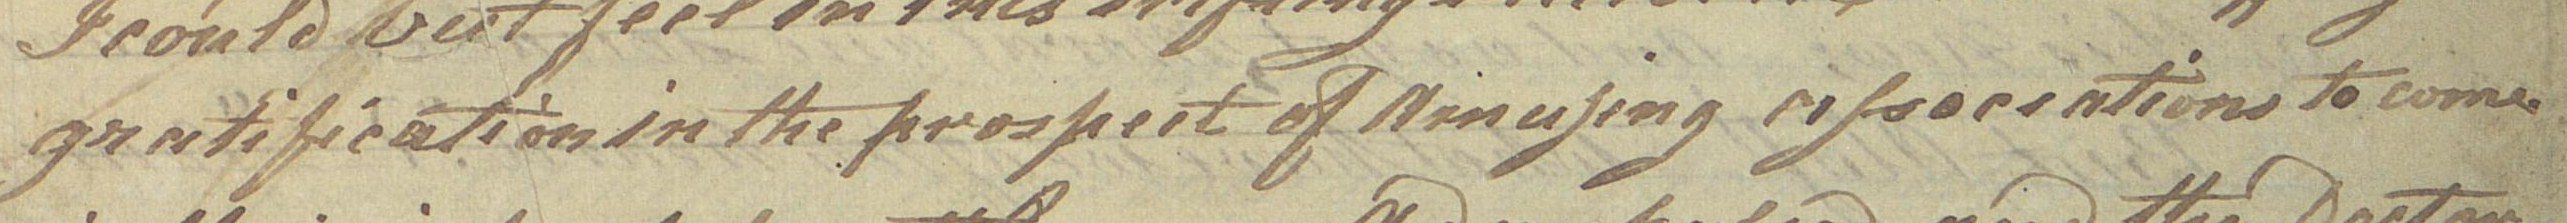gratification in the prospect of amusing associations to come
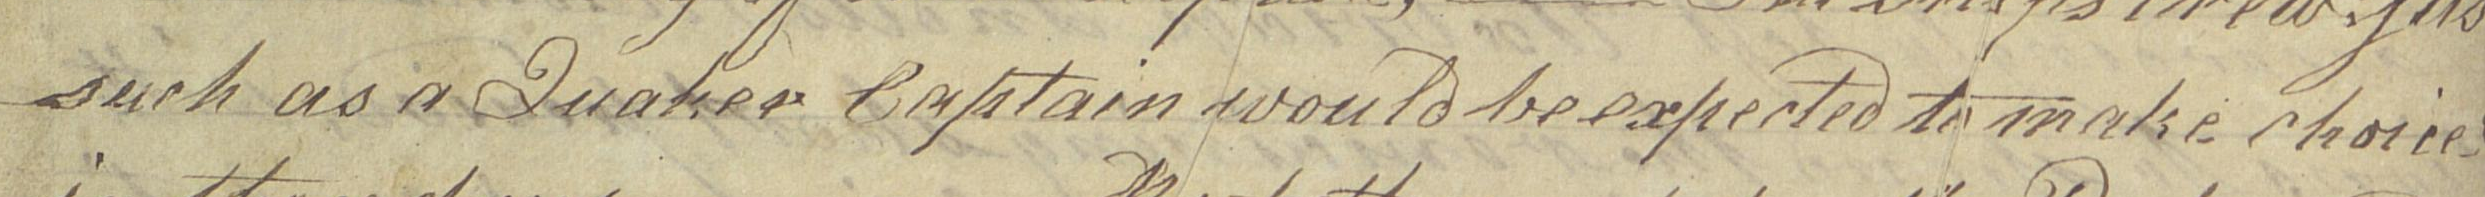such as a Quaker Captain would be expected to make choice
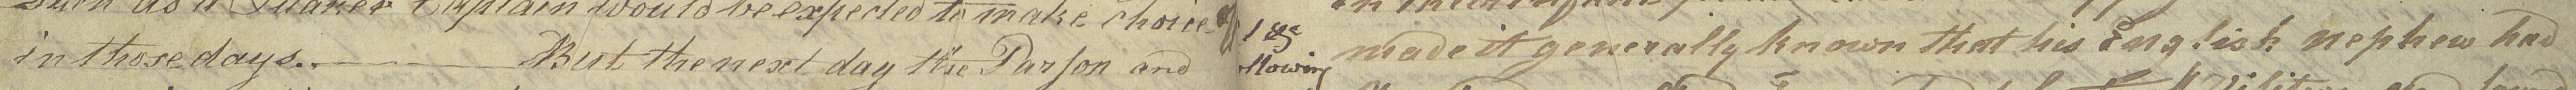in those days. But the next day the Parson and allowing made it generally known that his English nephew had
